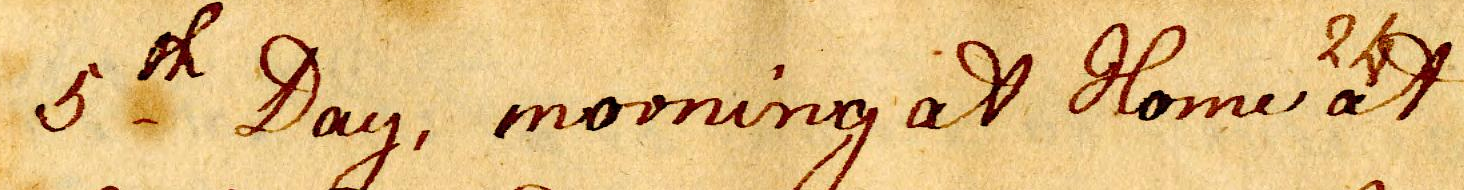5^th Day, morning at Home at
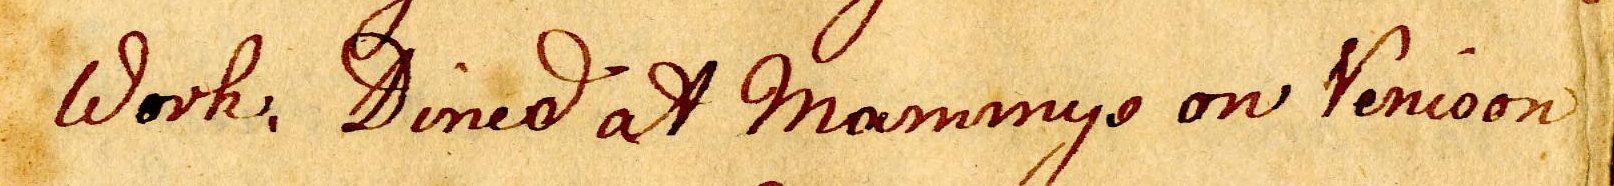Work, Dined at Mammys on Venison
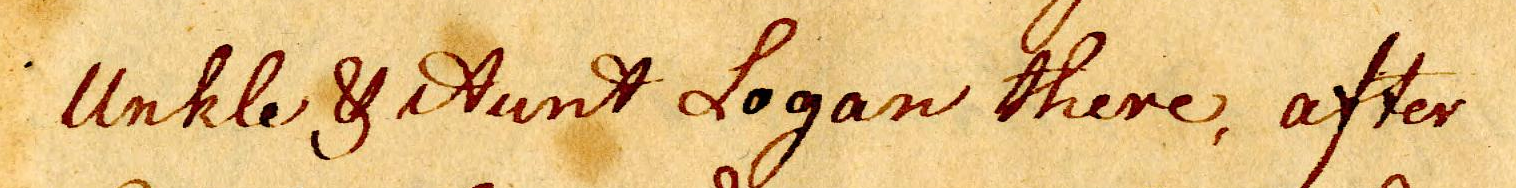Unkle & Aunt Logan there, after
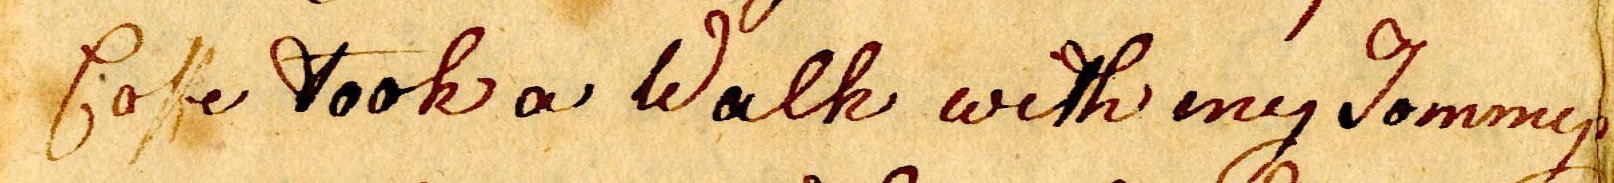Coffe took a Walk with my Tommy
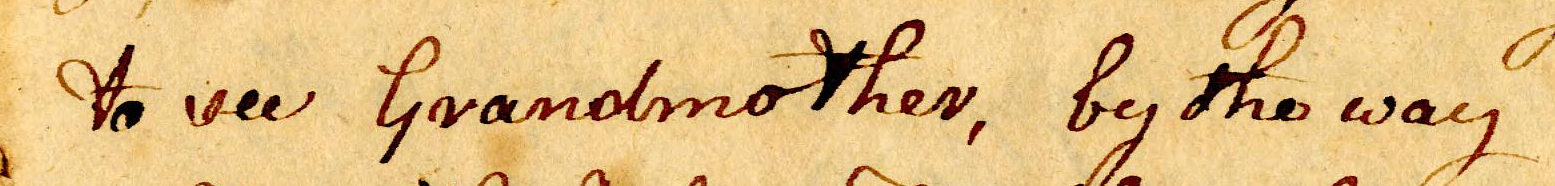to see Grandmother, by the way
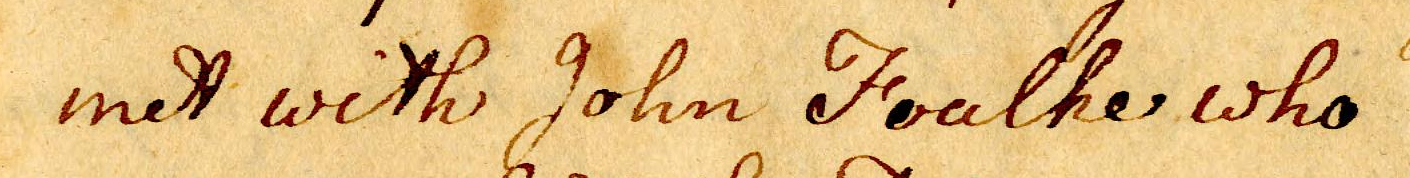met with John Foulke who
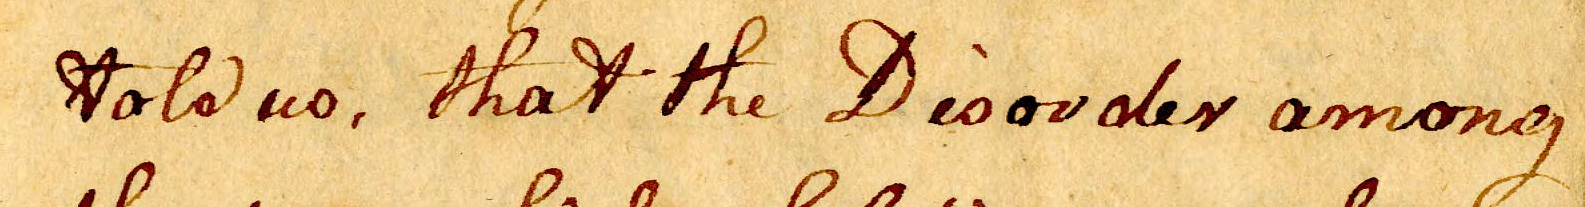told us, that the Disorder among
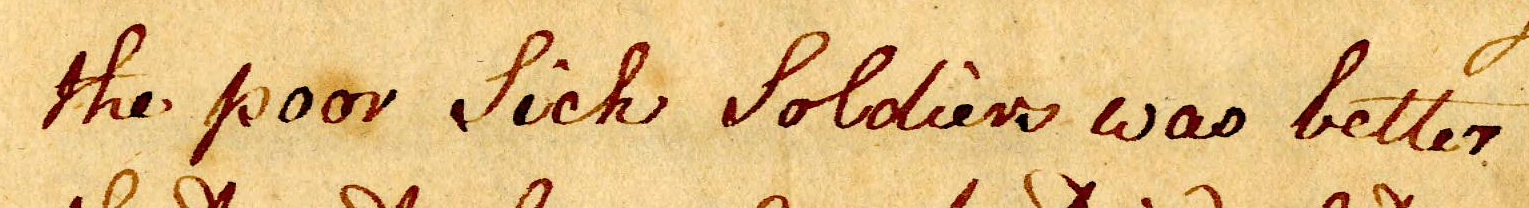the poor Sick Soldiers was better
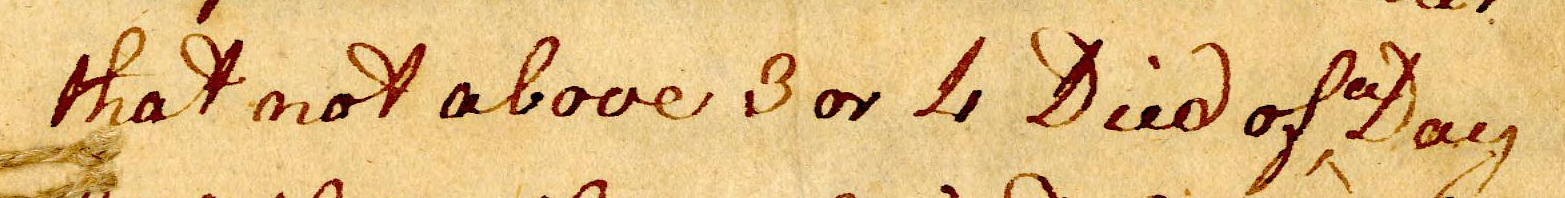that not above 3 or 4 Died of ^a Day
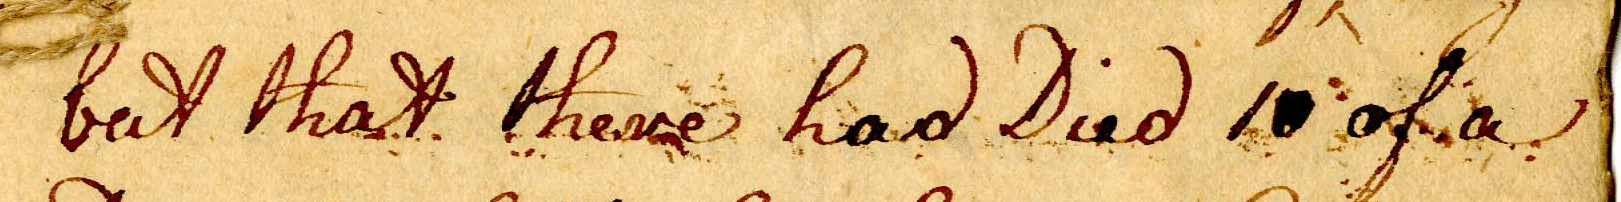but that there had Died 10 of a
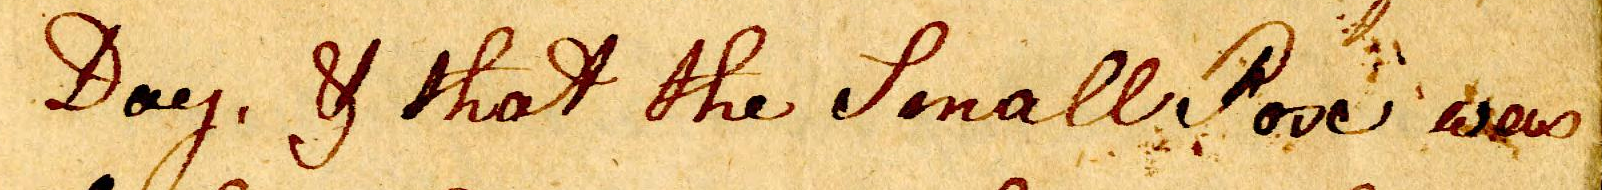Day, & that the Small Pox was
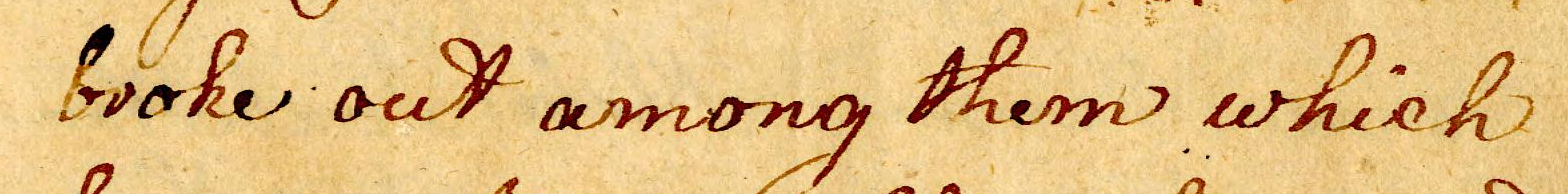broke out among them which
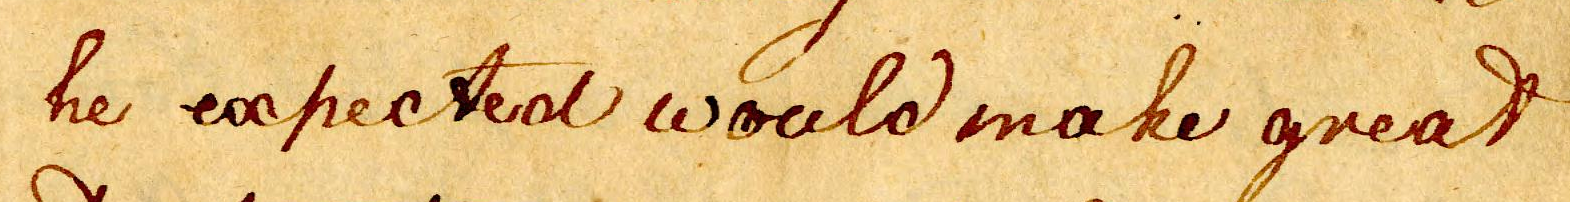he expected would make great
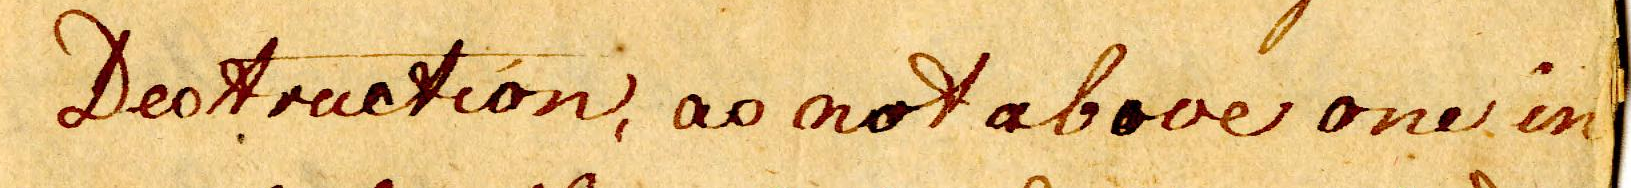Destruction, as not above one in
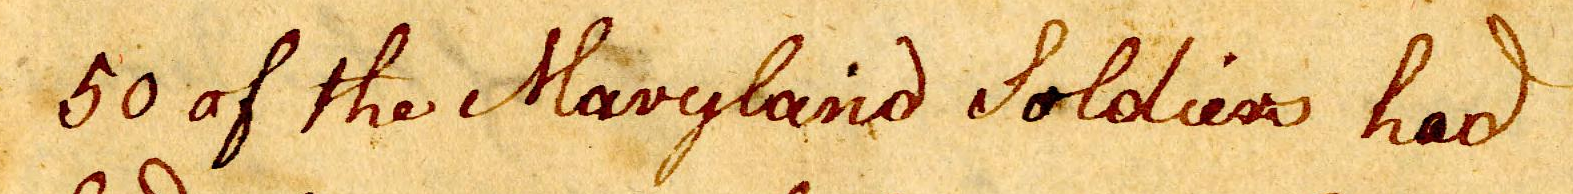50 of the Maryland Soldiers had
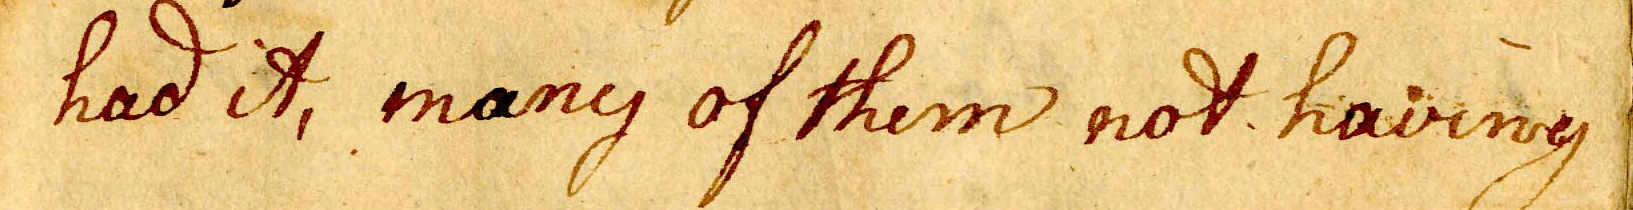had it, many of them not having
